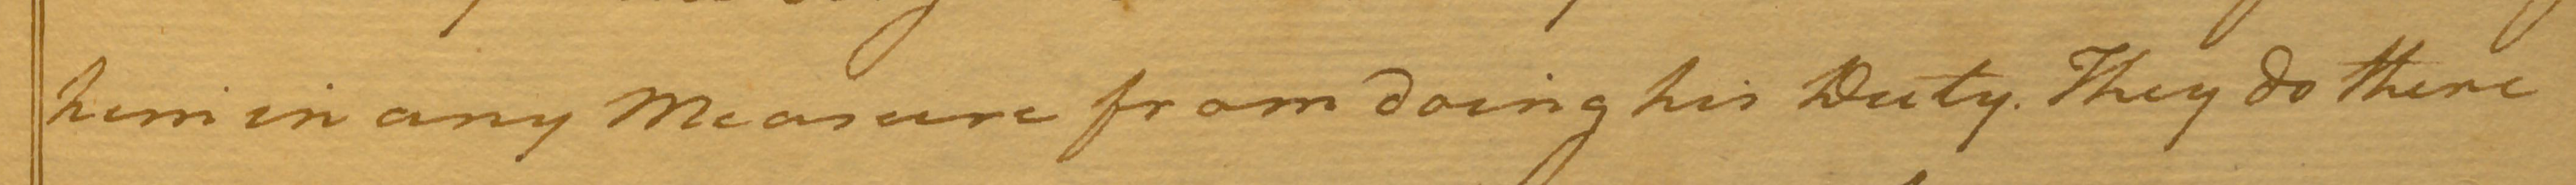him in any Measure from doing his Duty. They do there
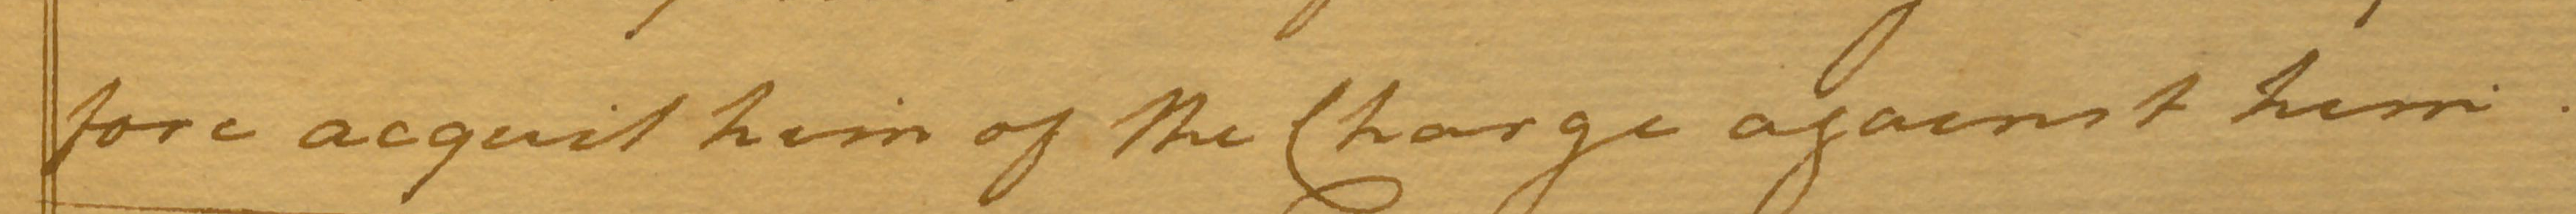fore acquit him of the Charge against him
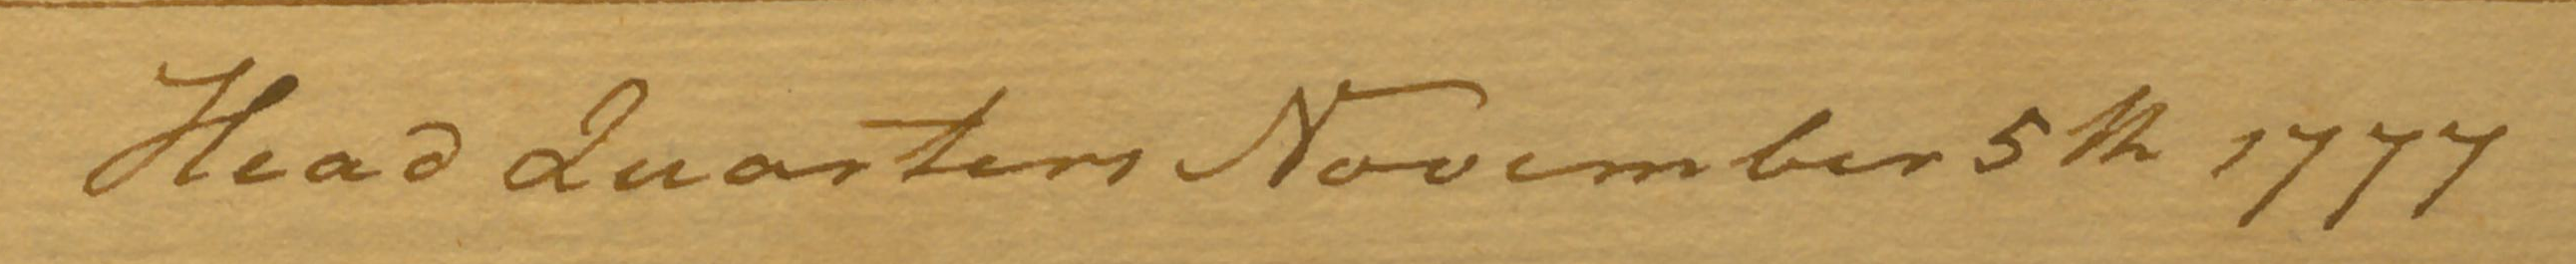Head Quarters November 5^th 1777
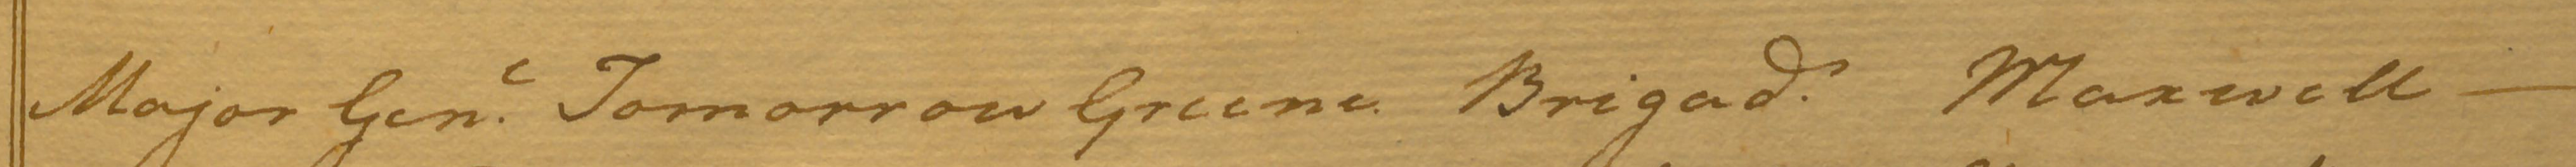Major Gen^l. Tomorrow Greene Brigad^r. Maxwell-
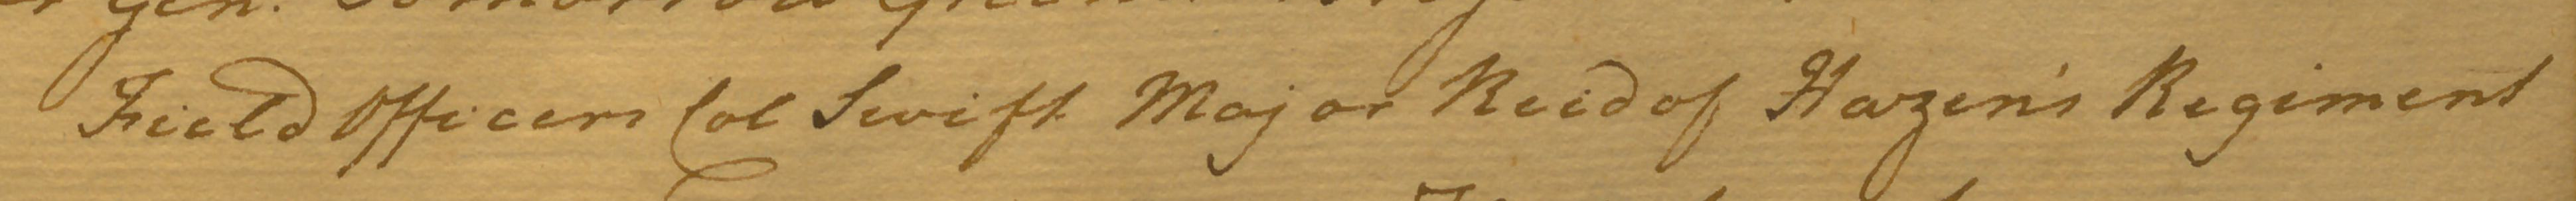Field Officers Col Swift Major Reid of Hazen's Regiment
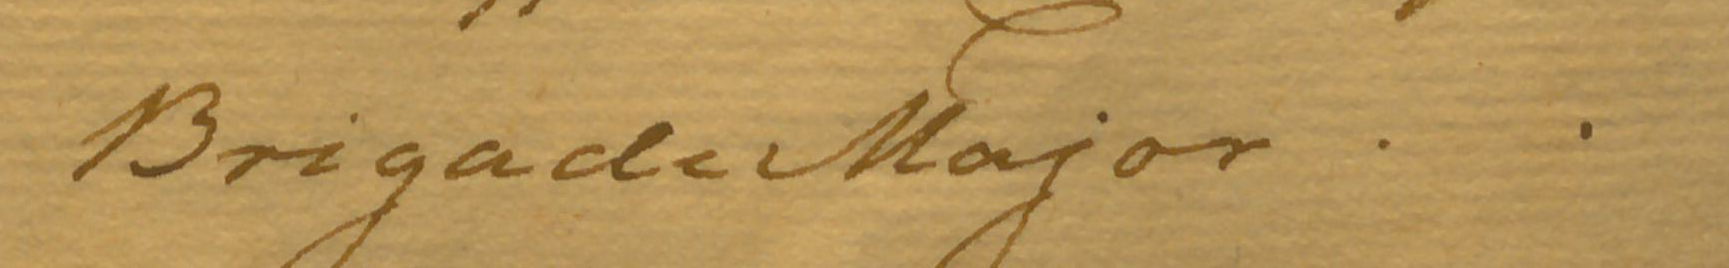Brigade Major ..
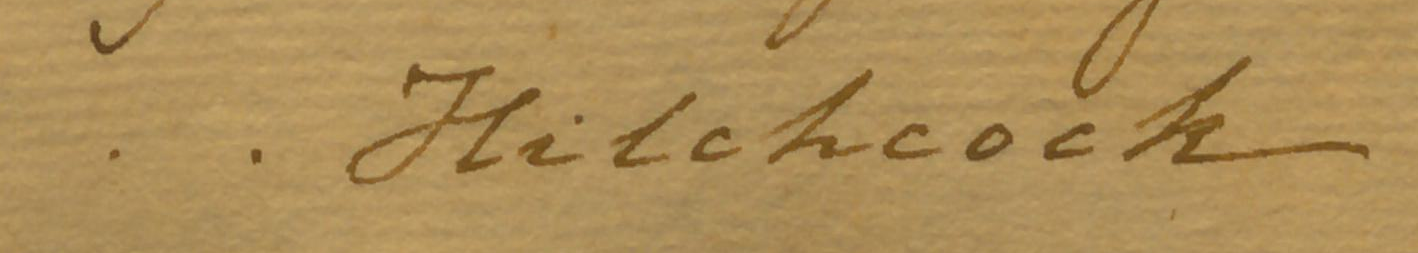.. Hitchcock
